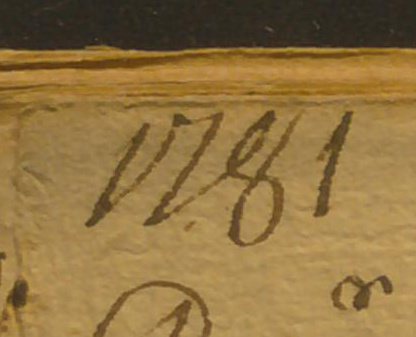1781
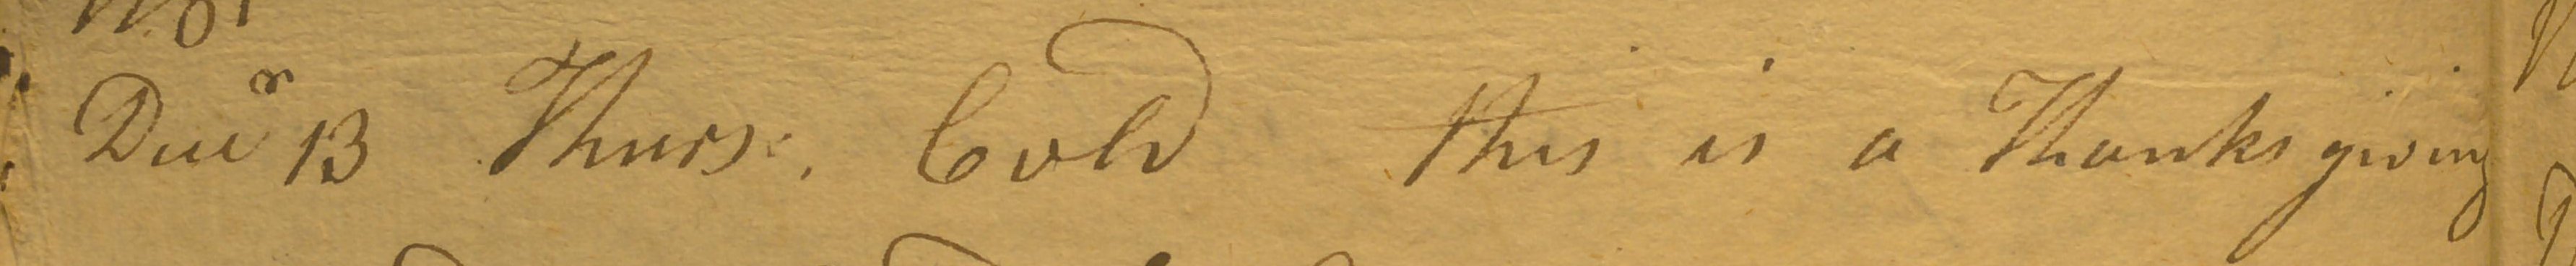Dece^r 13 Thurs. Cold this is a Thanksgiving
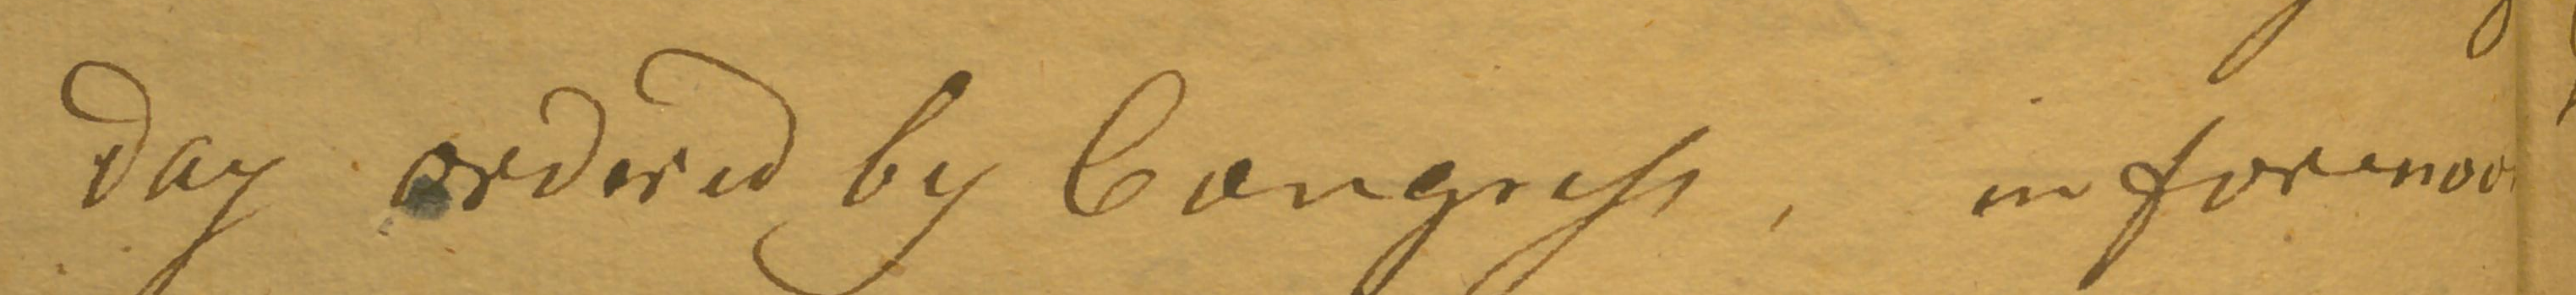day ordered by Congress, in forenoo
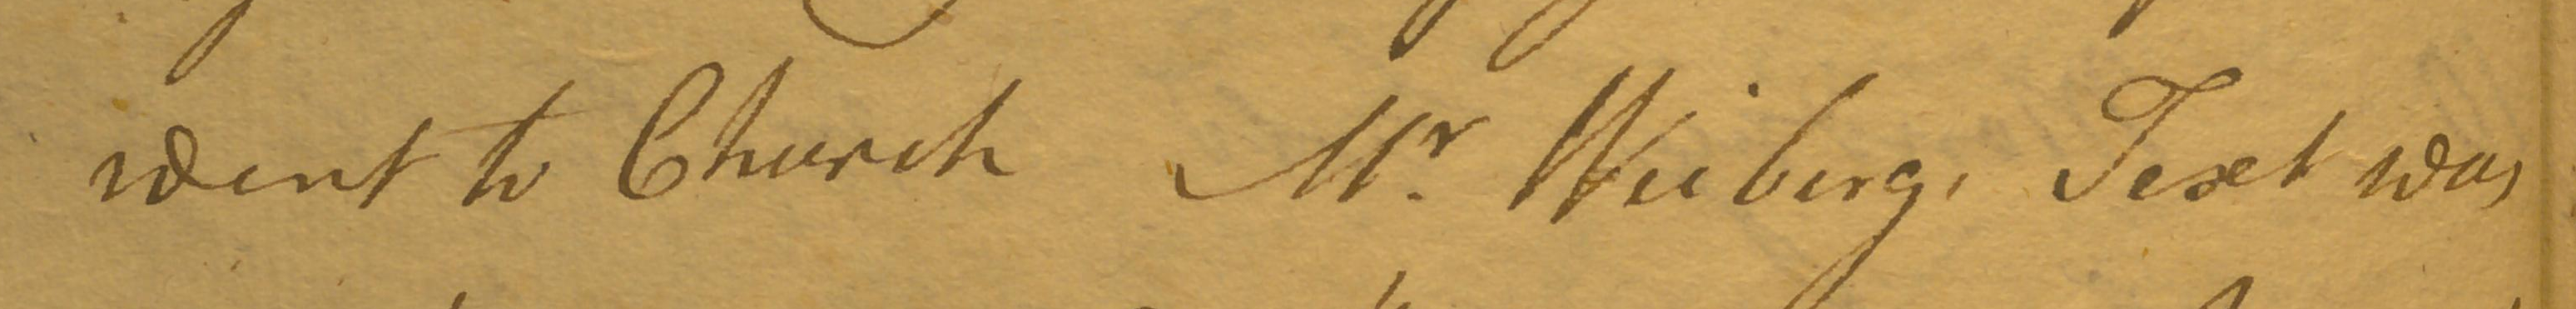went to Church M^r. Weibergs Text was
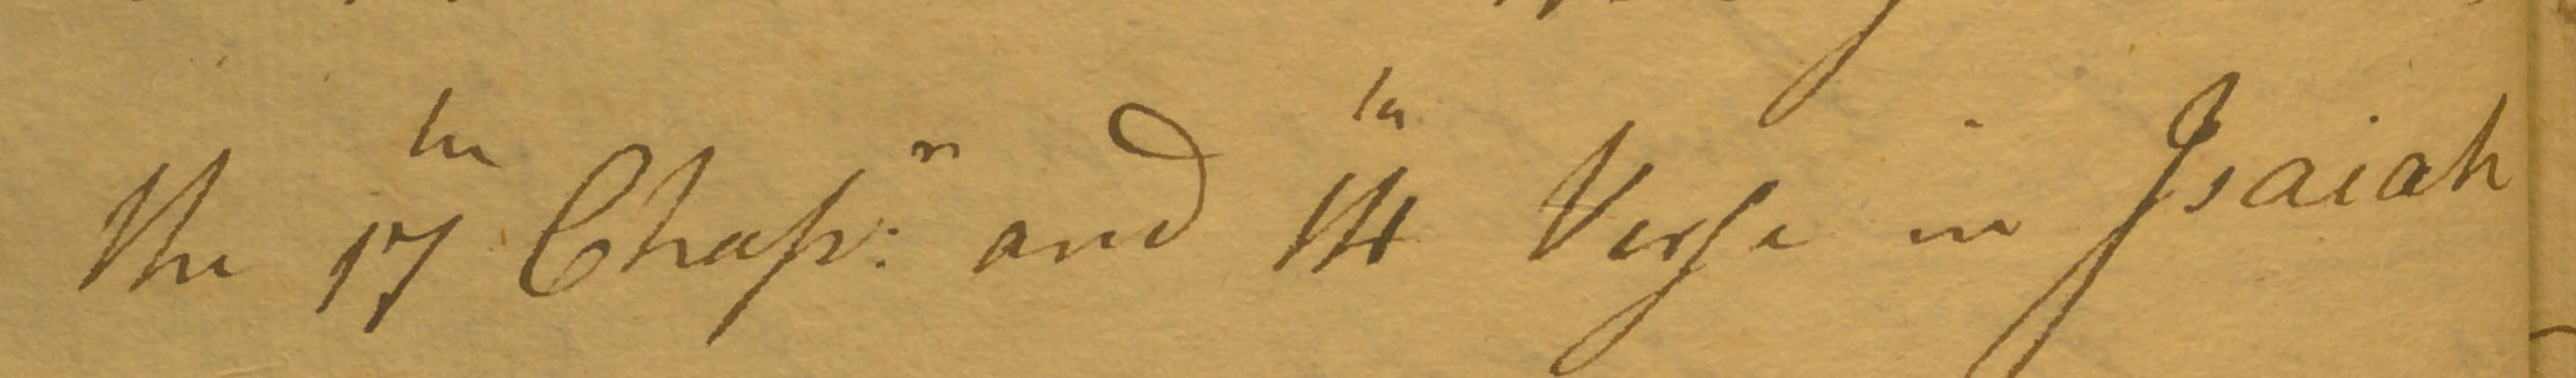the 17^th Chap: and 14^th Verse in Isaiah
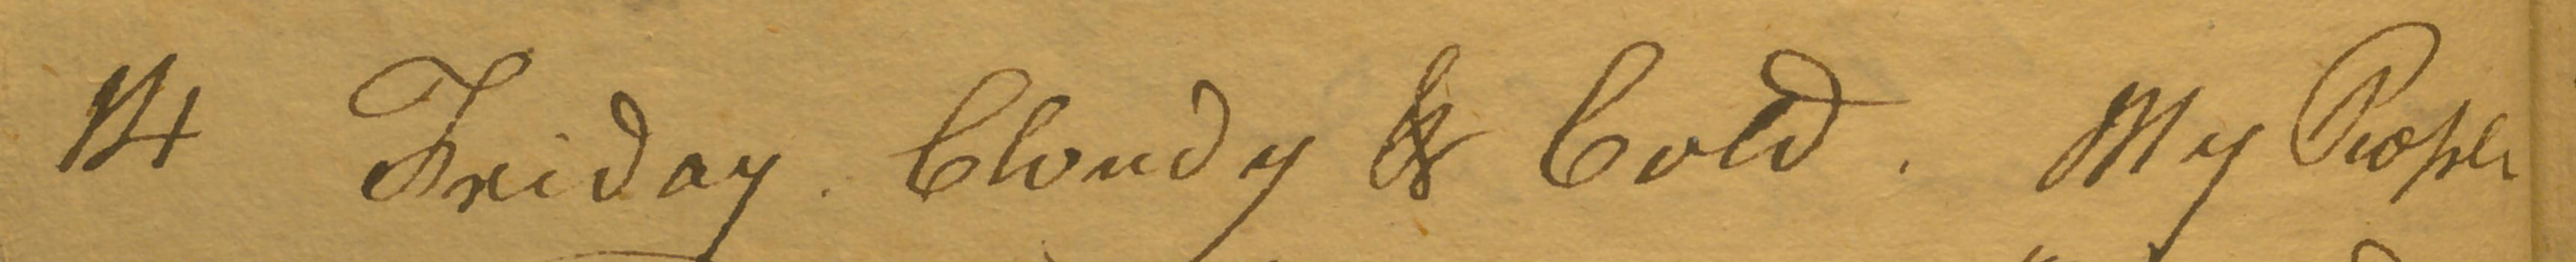14 Friday. Cloudy & Cold. My People
